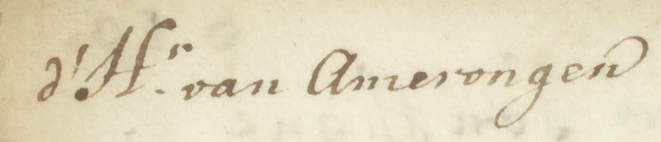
d'Hr. van Amerongen
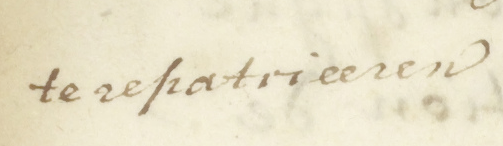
te repatrieeren
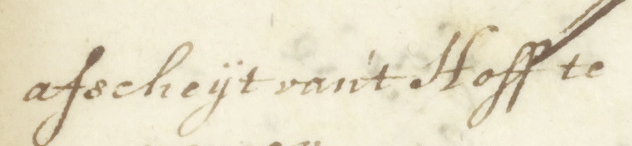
afscheijt van 't Hoff te
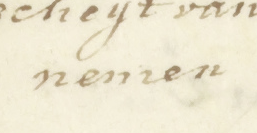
nemen
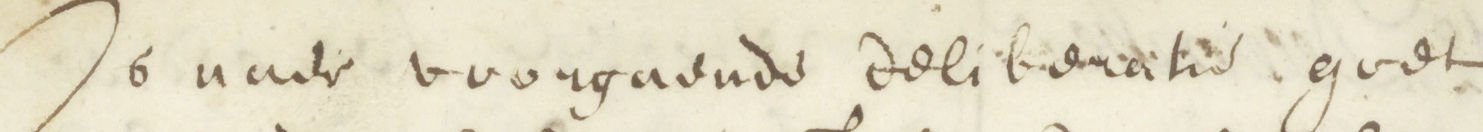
Is naer voorgaende deliberatie goet„
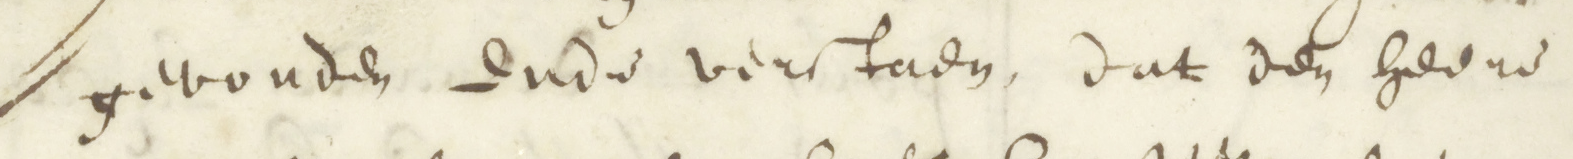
gevonden ende verstaen dat den heere
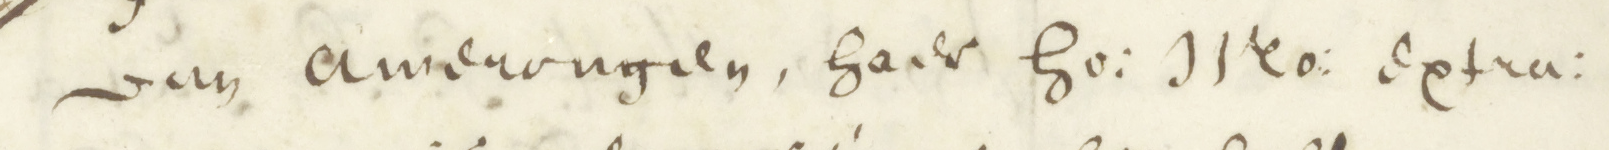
van Amerongen, haer Ho:Mo: extra„
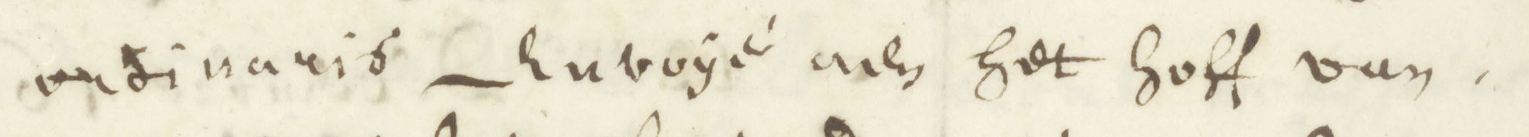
ordinaris Envoyé aen het hoff van,
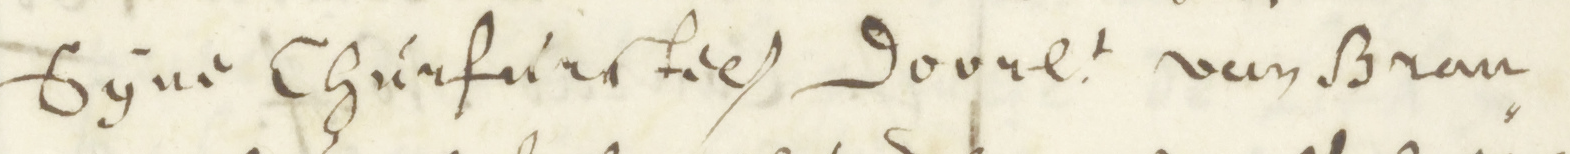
Sijne Churfurstele Doorlt van Bran„
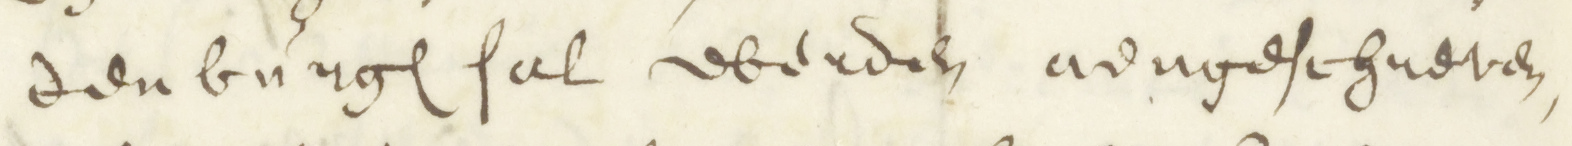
denburgh sal werden aengeschreven
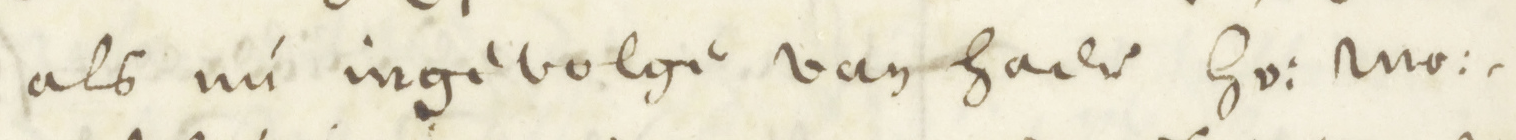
als nu ingevolge van haer Ho:Mo:
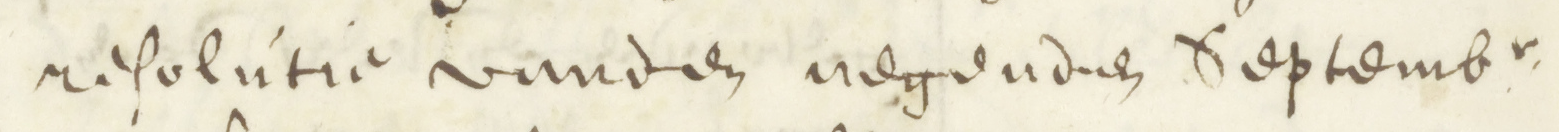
resolutie vanden negenden Septembr
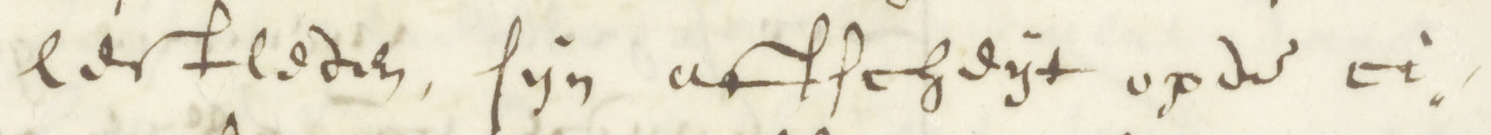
lestleden sijn affscheijt opde ci„
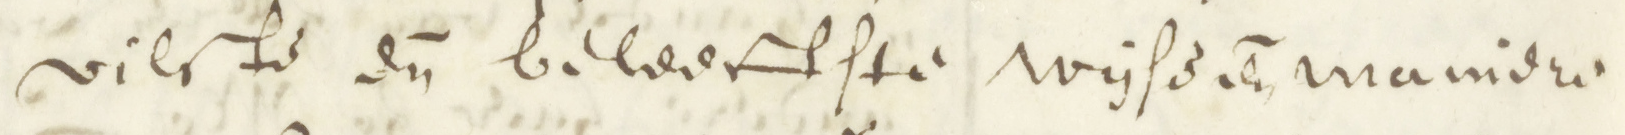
vilste en beleefffste wijse en maniere
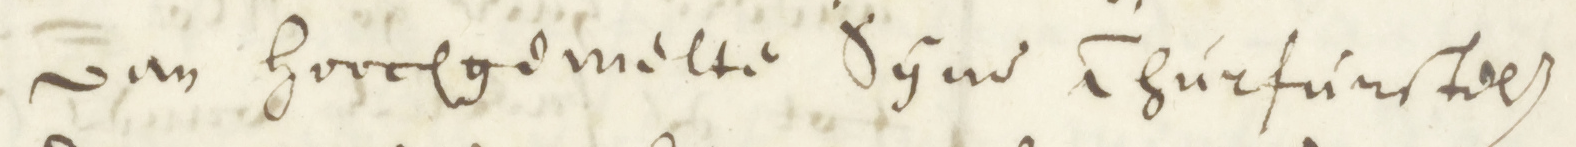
van hoochgemelte Sijne Churfustel
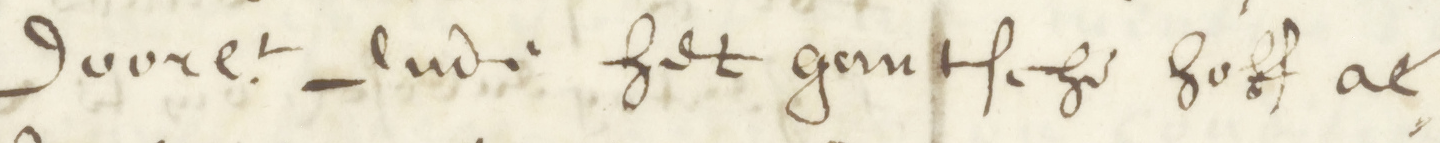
Doorlt ende het gantsche hoff al
